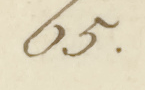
65.
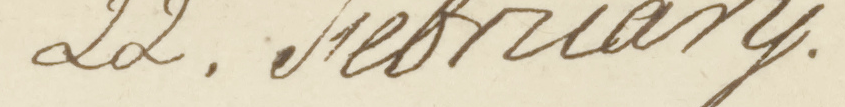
22. Februarij.
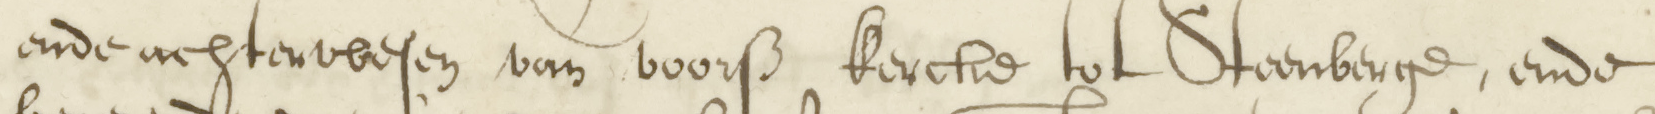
ende achterwesen van voors kercke tot Steenberge, ende
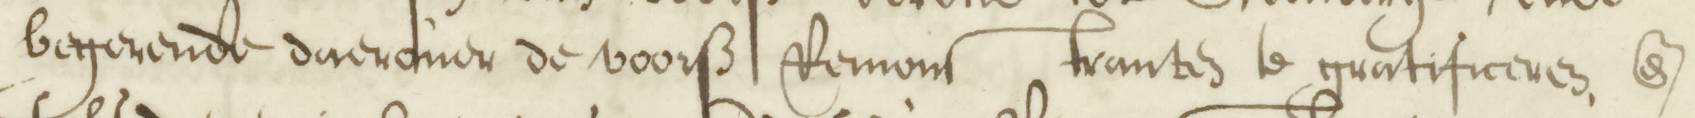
begerende daerouer de voors Remonstranten te gratificeren &
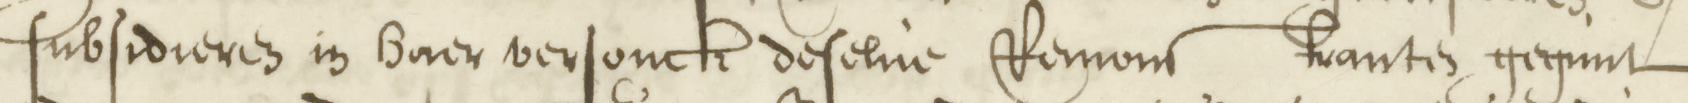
subsidieren in haer versouck deselue Remonstranten gegunt
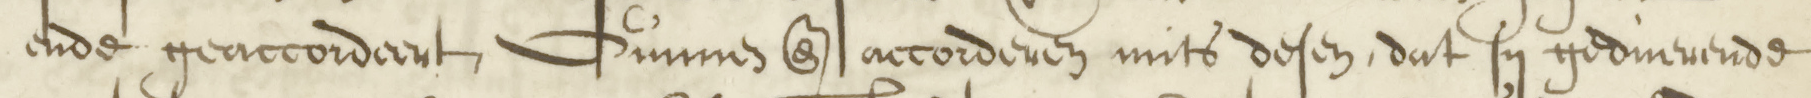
ende geaccordeert, Gunnen & accorderen mits desen, dat sy geduerende
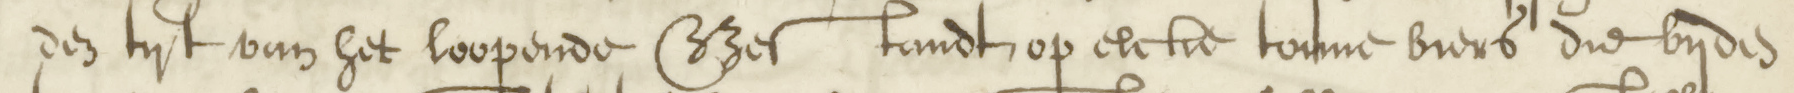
den tyt van het loopende Bestandt, op elcke tonne biers die byden
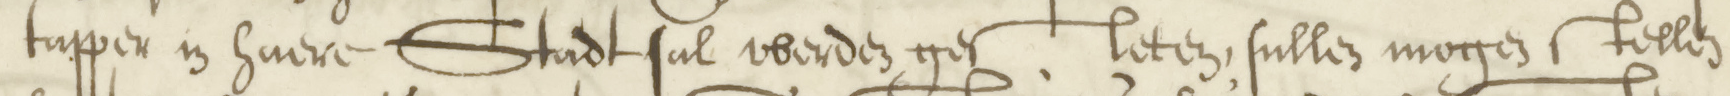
tapper in haere Stadt sal worden gesleten, sullen mogen stellen
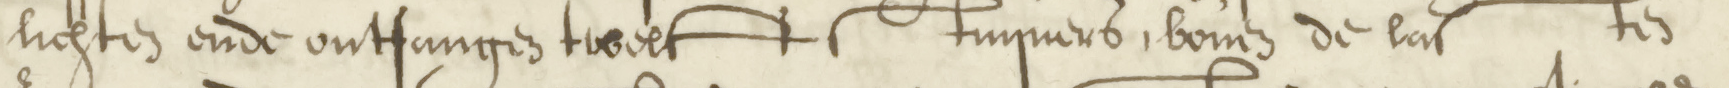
lichten ende ontfangen twelff stuyuers boven de lasten
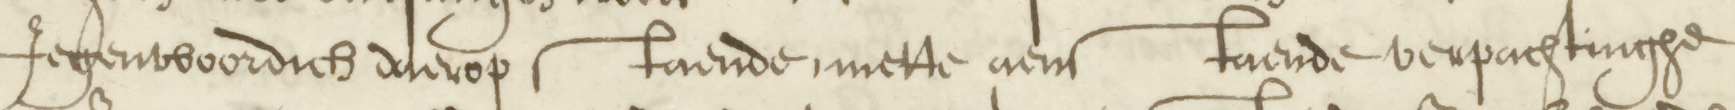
Jegenwoordich daerop staende, mette aenstaende verpachtinghe
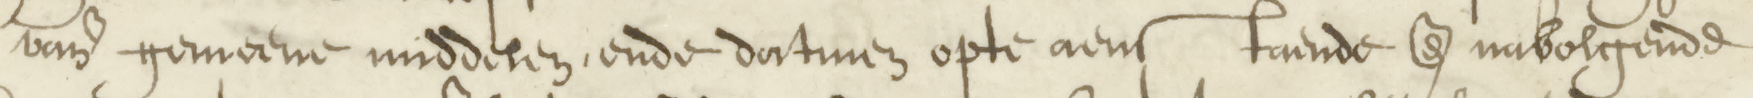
van gemeene middelen, ende datmen opte aenstaende & navolgende
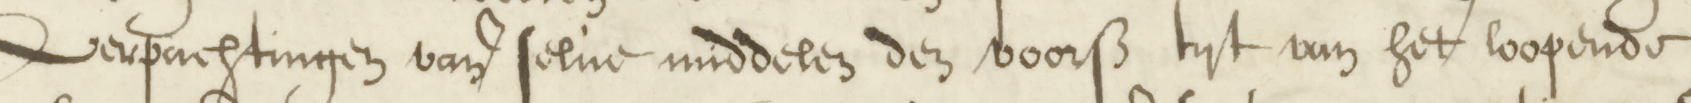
verpachtingen van selue middelen den voors tyt van het loopende
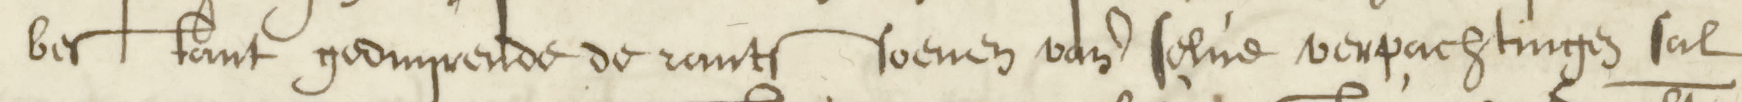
bestant geduyrende de rantssoenen van selue verpachtingen sal
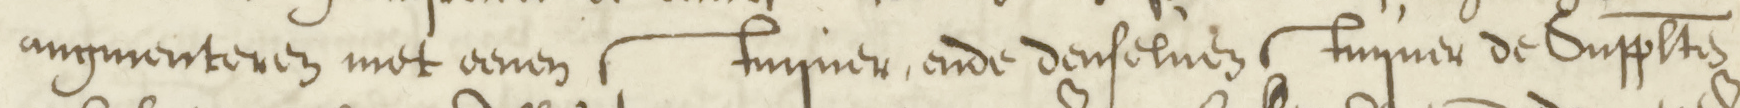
augmenteren met eenen stuyuer ende denseluen stuyuer de Supplten
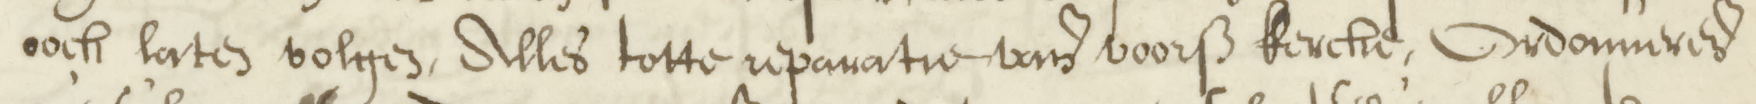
oock laten volgen. Alles totte reparatie van voors kercke. Ordonneren
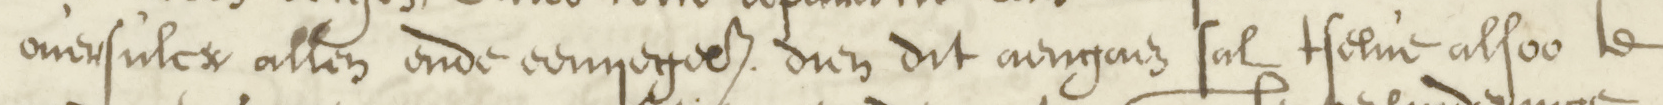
ouersulcx allen ende een eenyjgel dien dit aengaen sal tselue alsoo te
